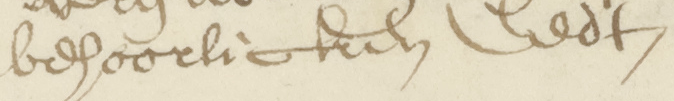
behoorlicken Eedt.
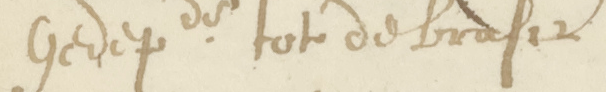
Gedepden tot de brasi„„
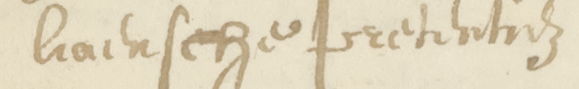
liaensche pretentien
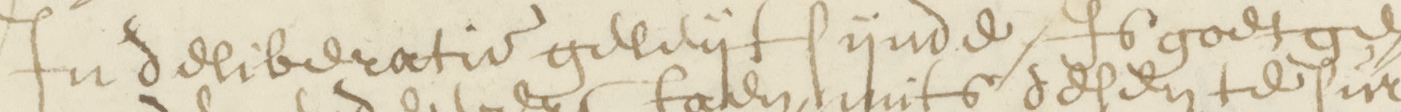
In deliberatie geleijt sijnde, Is goetge„
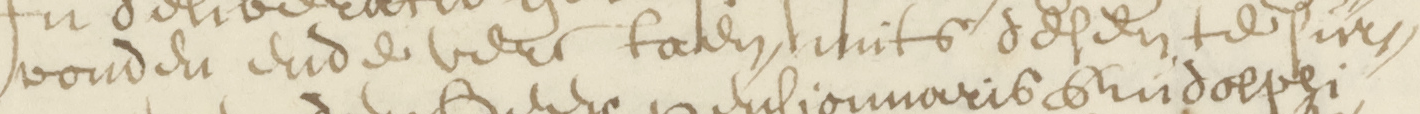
vonden ende verstaen mits desen te sur„
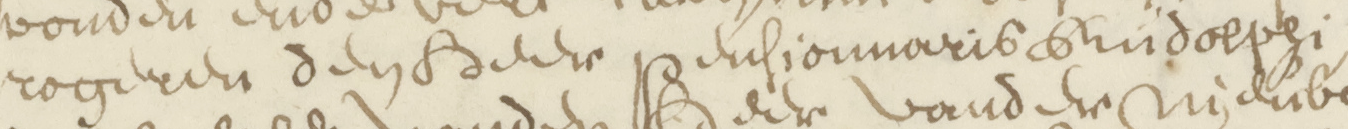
rogeren den Heer pensionnaris Rudolphi
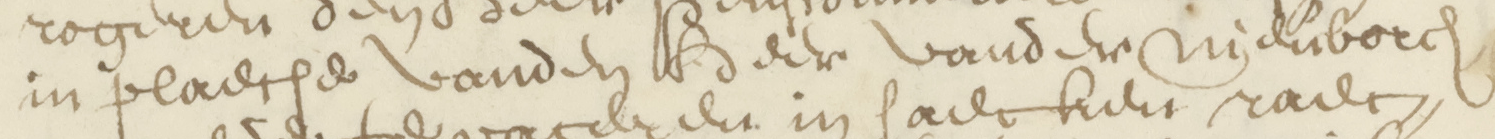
in plaetse vanden Heer vander Nieuborch
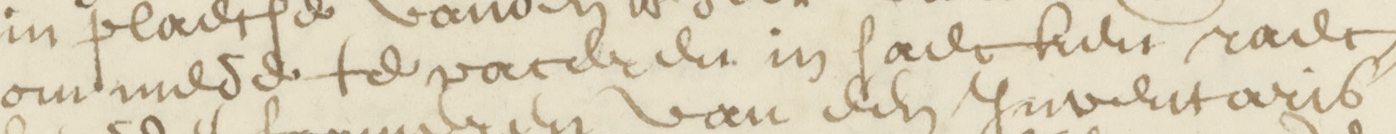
om mede te vaceren in saecken raec„
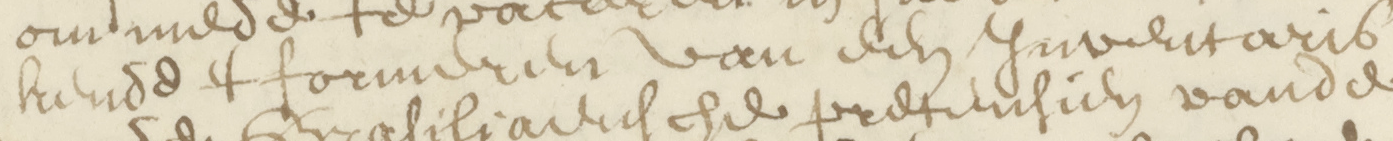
kende t formeren van den Inventaris
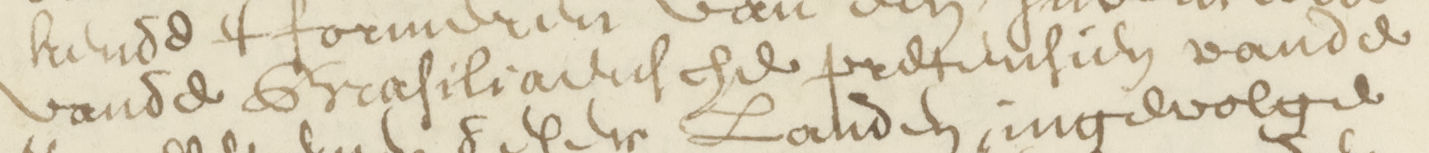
vande Brasiliaensche pretensien vande
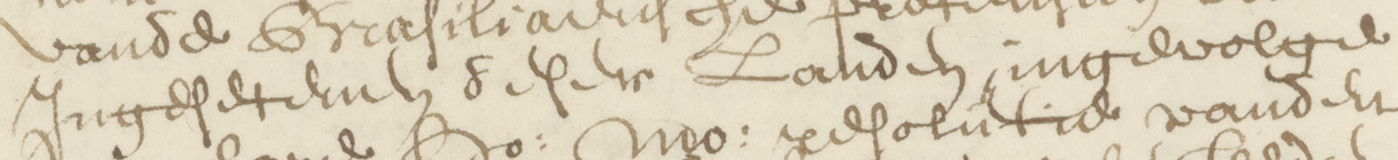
Ingesetenen deser Landen, ingevolge
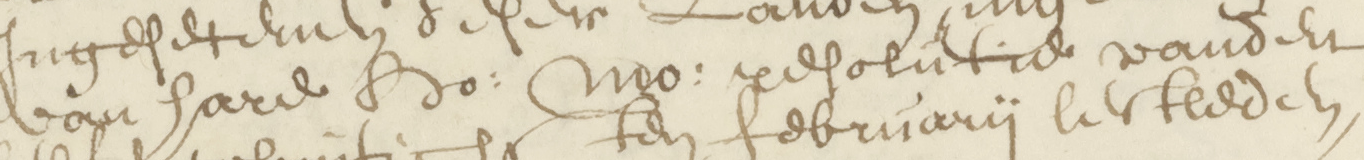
van hare Ho:Mo: resolutie vanden
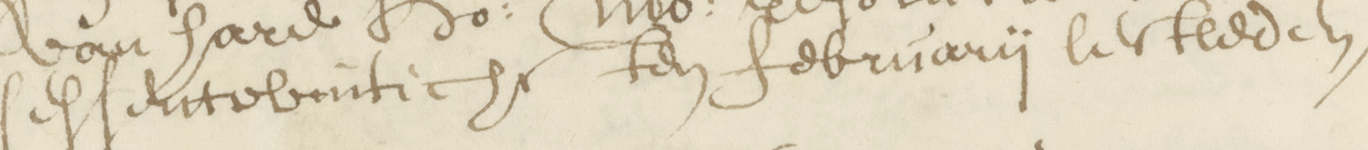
sessentwintichsten februarij lesteleden.
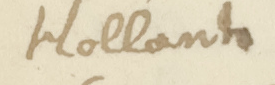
Hollant
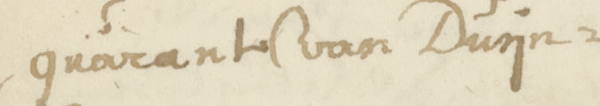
guarants van Duijn„
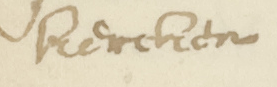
kercken
